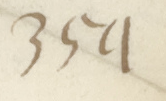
354
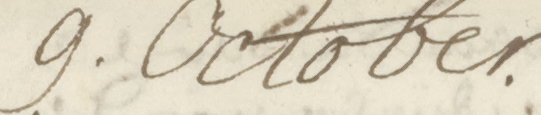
9. October.
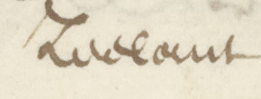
Zeelant
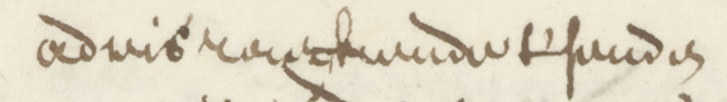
advis raeckende t'houden
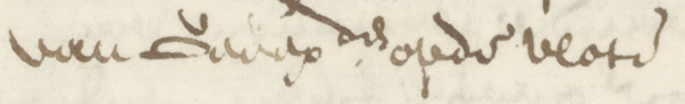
van Gedepden. opde vlote
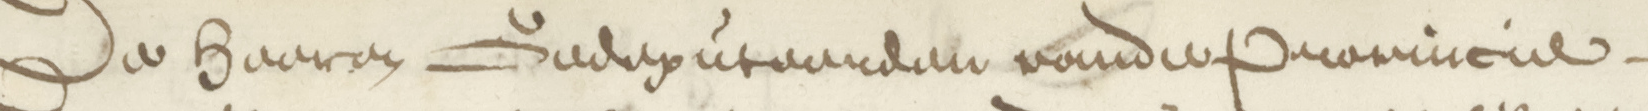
De heeren Gedeputeerden vande Provincie —
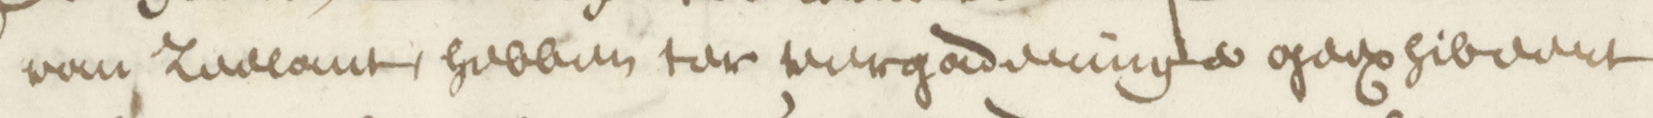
van Zeelant, hebben ter vergaderinge geexhibeert
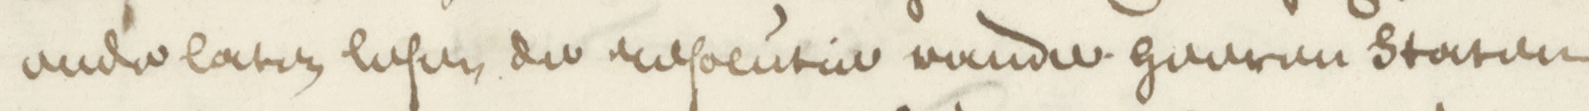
ende laten lesen de resolutie vande heeren Staten
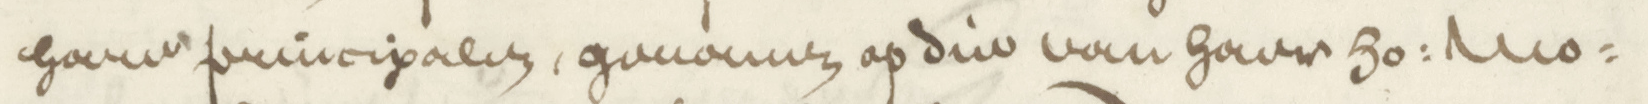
hare principalen, genomen op die van haer Ho:Mo:
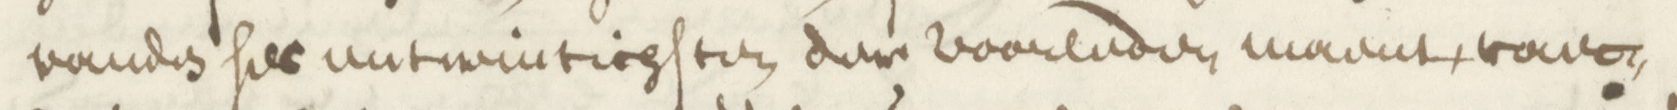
vanden ses entwintichsten der voorleden maent, raec,,
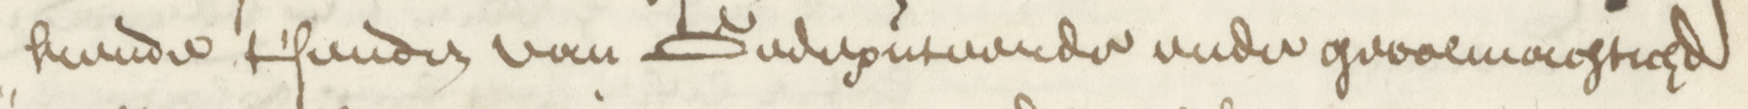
„kende t'senden van Gedeputeerde ende gevolmachtichd
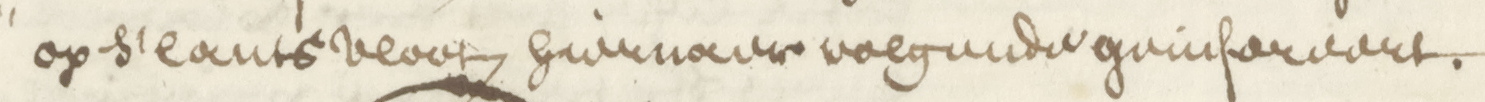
op s'lants vloot, hiernaer volgende geinsereert.
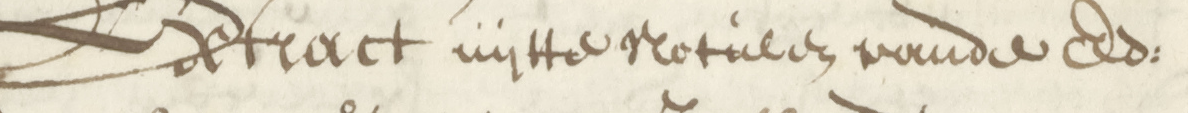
Extract uijtte Notulen vande Ed:
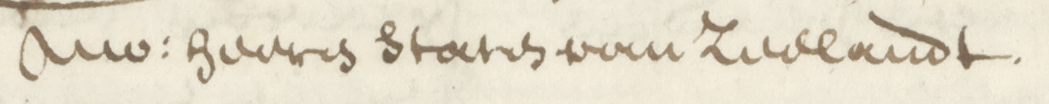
Mo: heeren staten van Zeelandt.
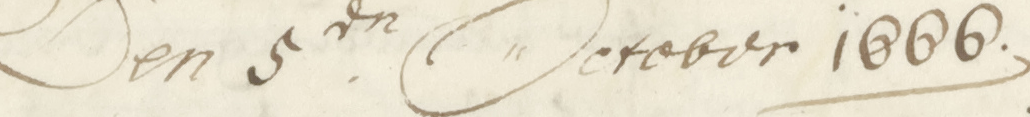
Den 5en October 1666.
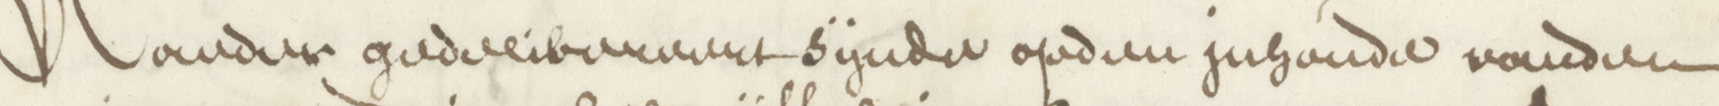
Naerder gedelibereert sijnde opden inhoude vanden
